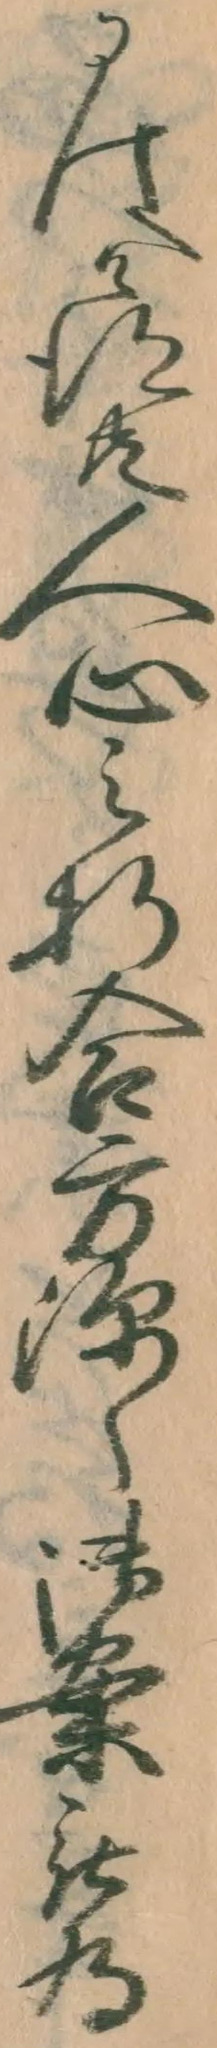には候得共人心之折合方深く御案被為
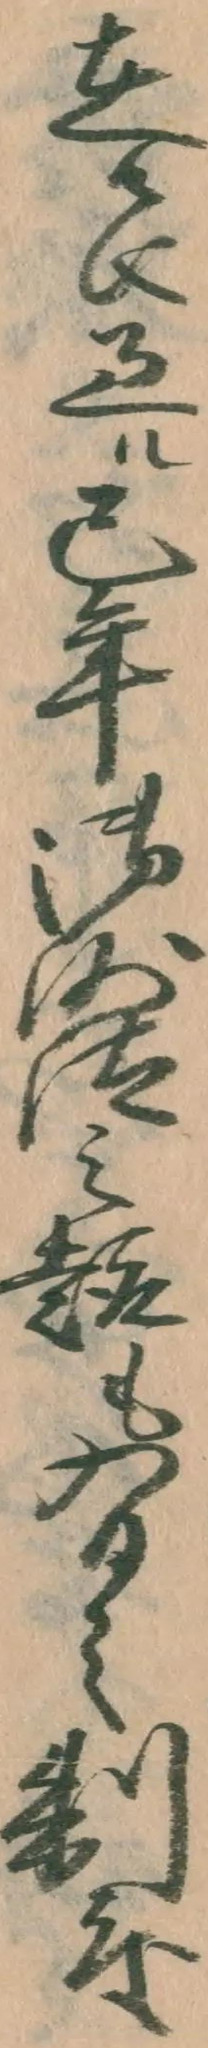在候由過ル巳年御沙汰之趣も有之制度
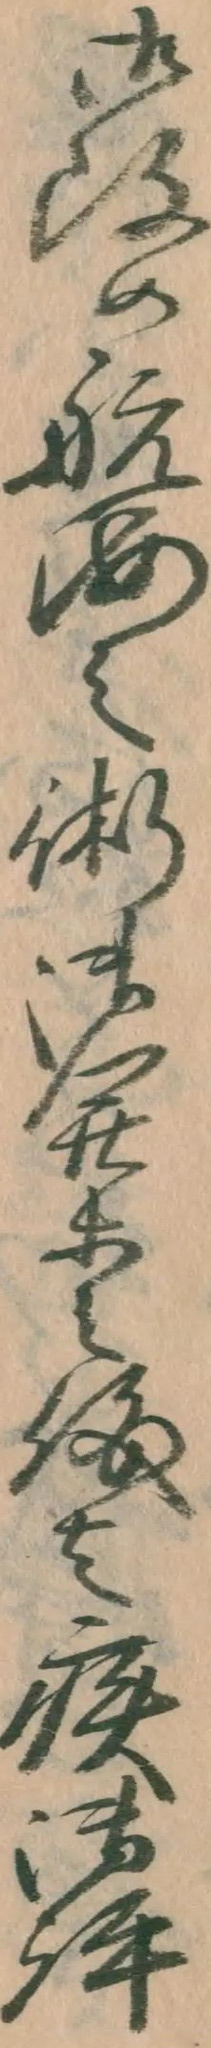御改め航海之術御開等之儀者疾御評
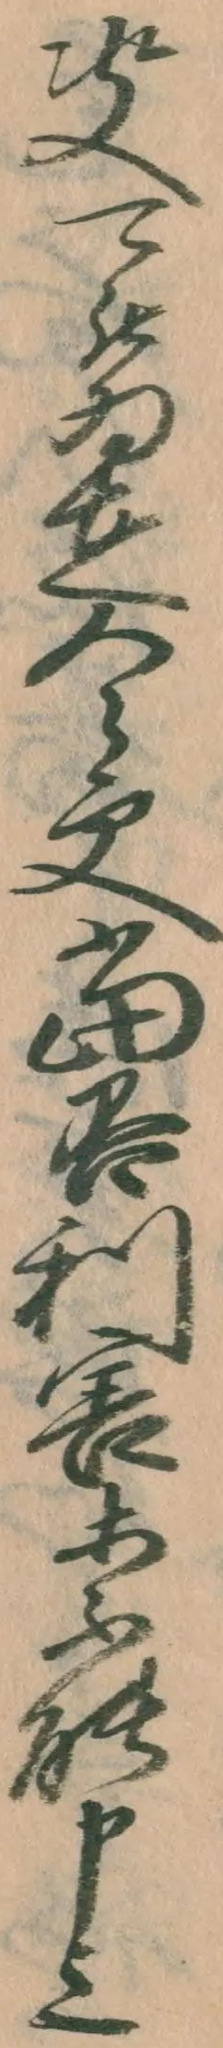決可被為在今更當否利害等不能申上
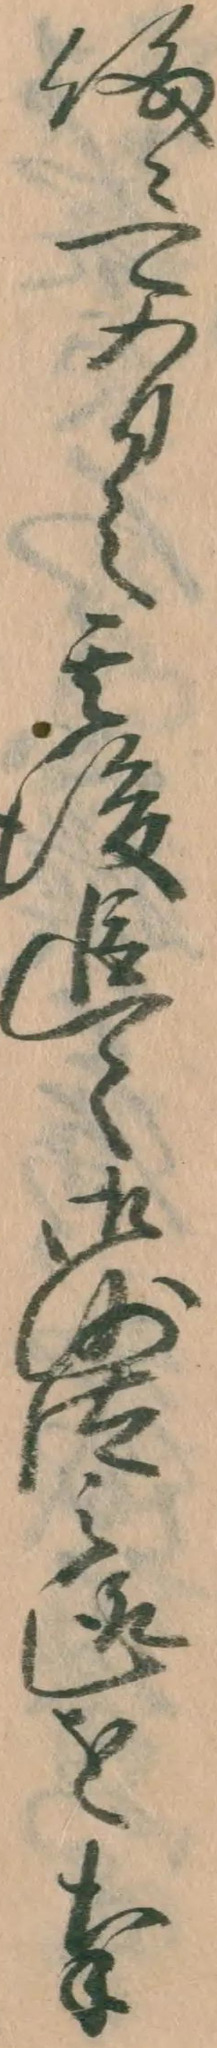儀ニ可有之其後追々御沙汰之趣を奉
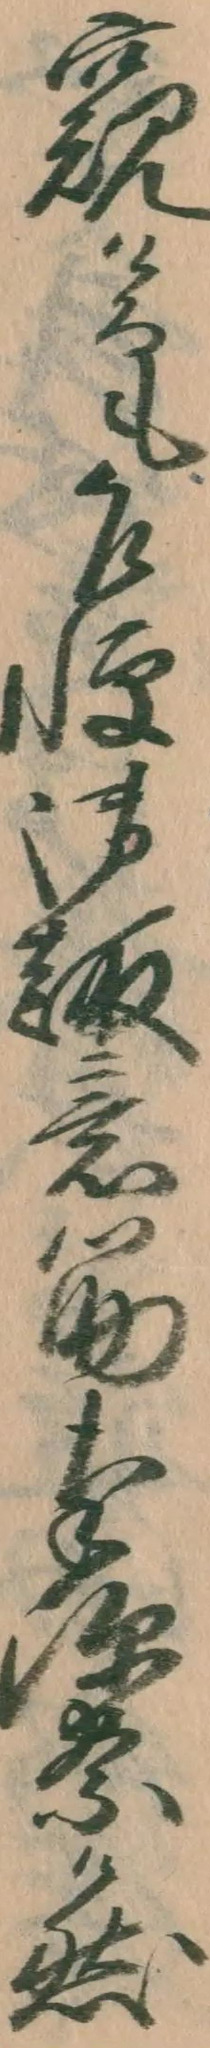窺候而も乍憚御趣意筋奉深察候然
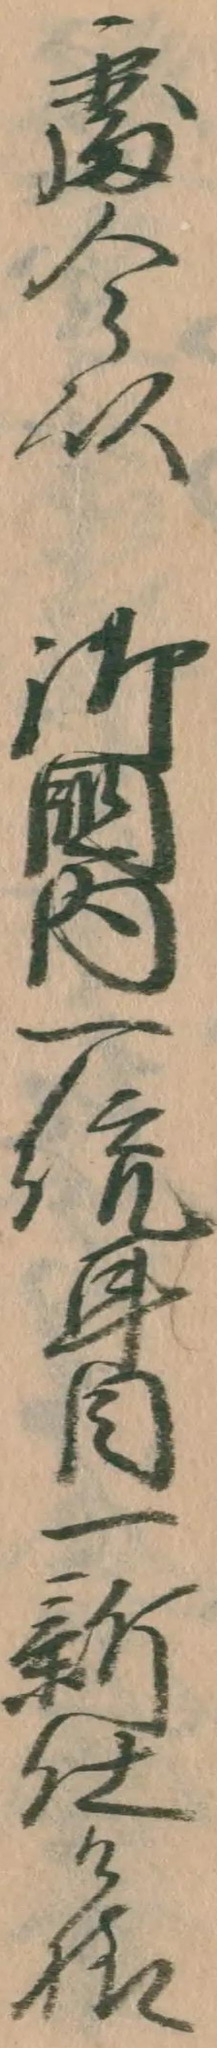処今以御国内一統耳目一新仕候様
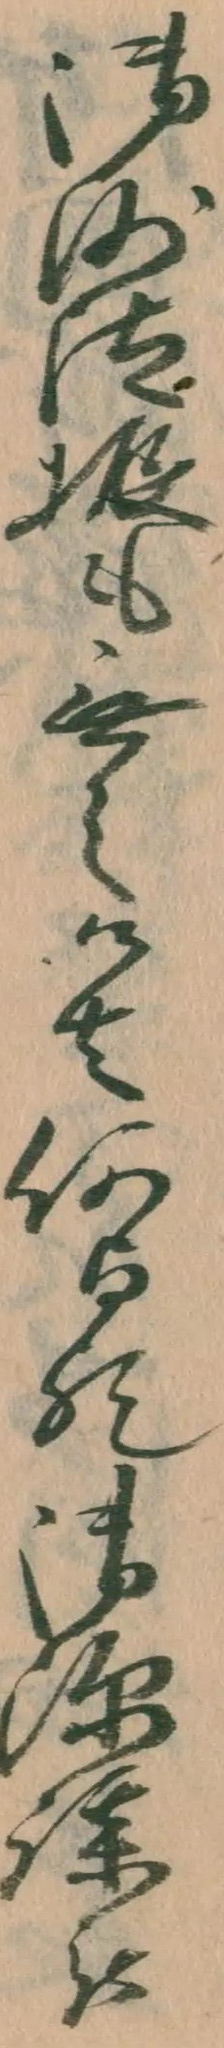御沙汰振も無之候者何とか御深謀被
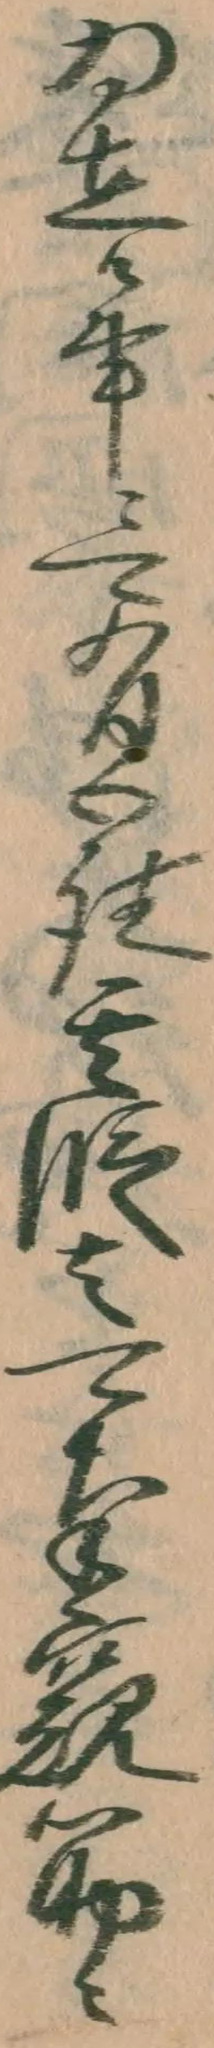為在候事ニ可有御座其段者可奉窺筋二
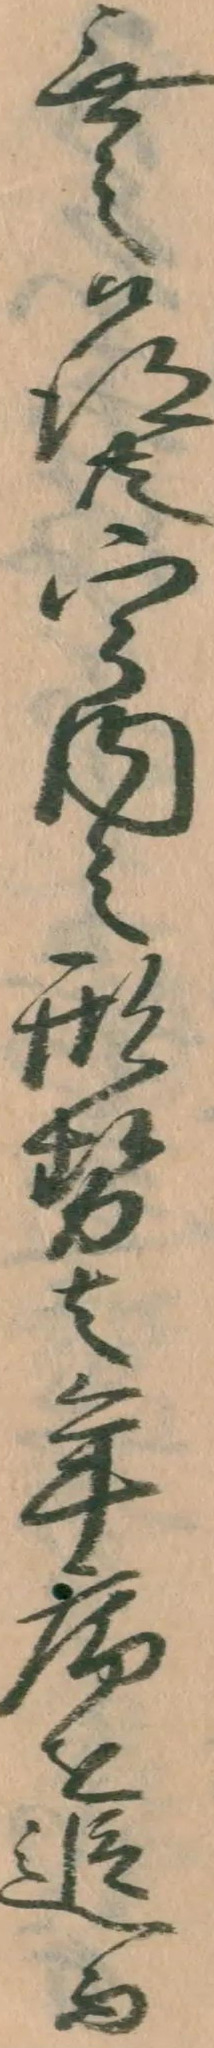無之候得共宇内之形勢者年序を追而
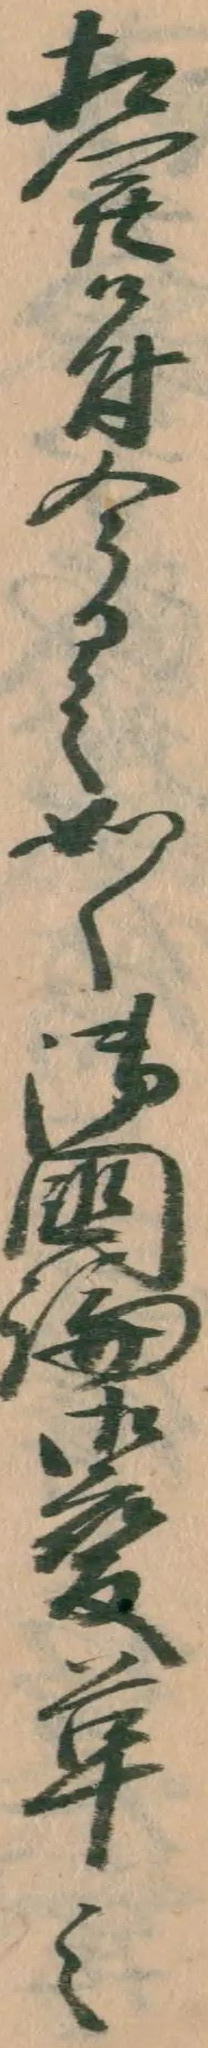相開候付今日之如く御国論変革之
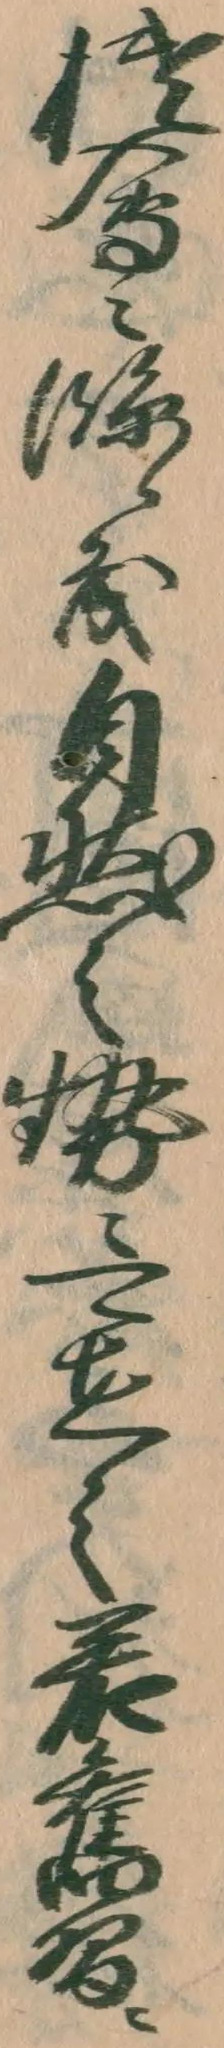機會二臨候も自然之勢二可在之若舊習二
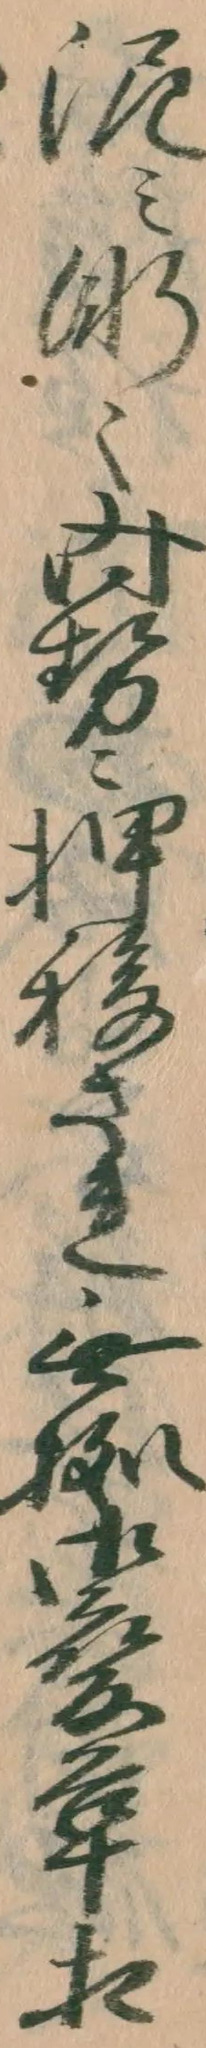泥ミ漸々時勢二押移され無拠御変革相
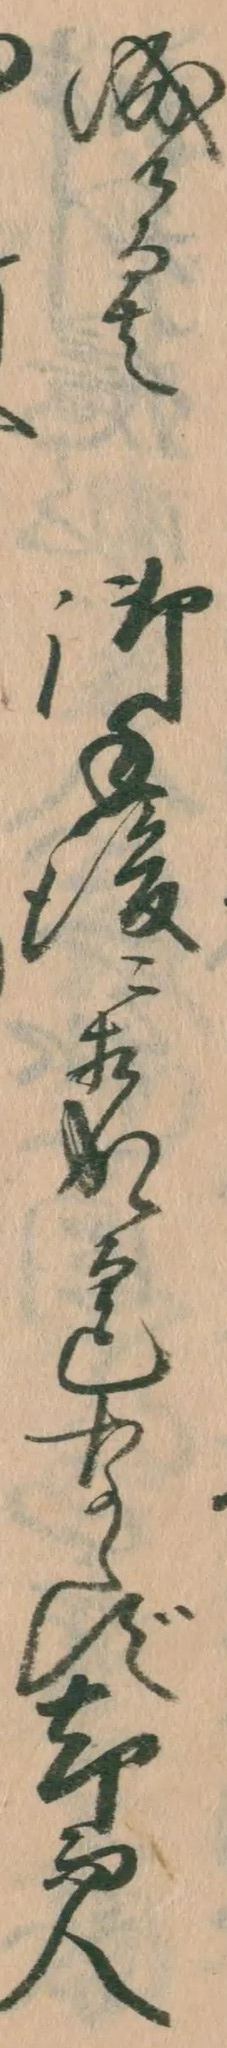成候而者御手後ニ相成候而已ならず却而人
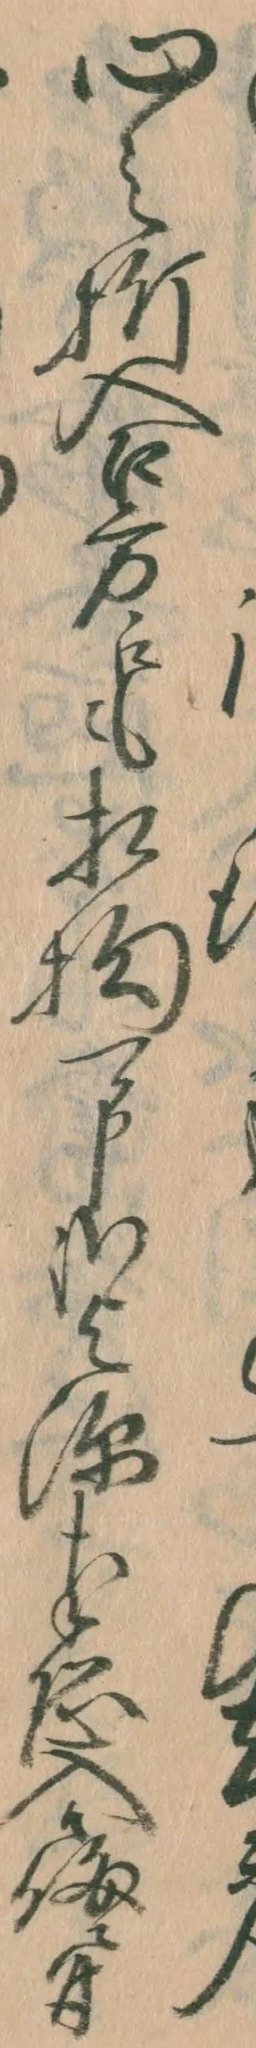心之折合方えも相拘可申哉と深奉恐入候儀ニ付
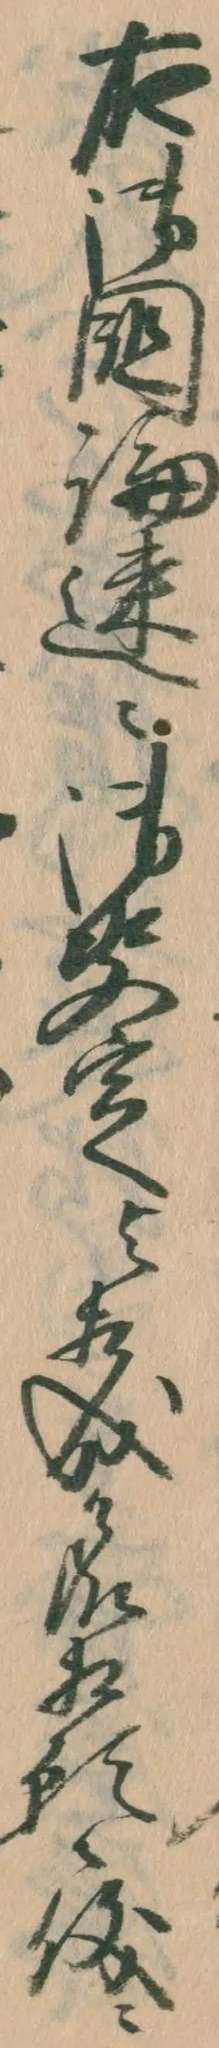右御国論速二御決定と相成候様相願候儀ニ
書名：麗斎叢書. 20
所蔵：国立国会図書館 National Diet Library, JAPAN
